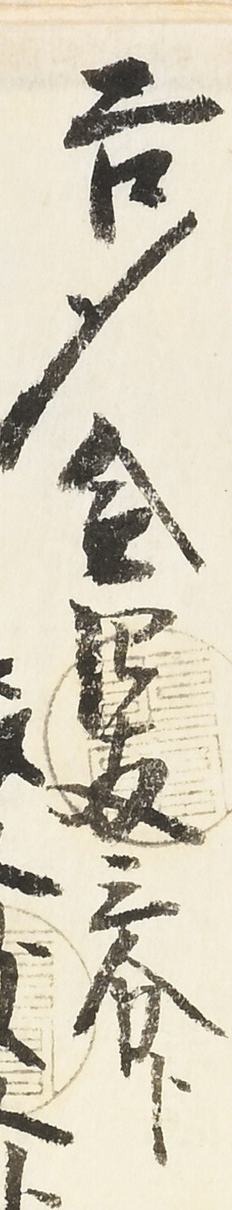二口〆金四両三分ト
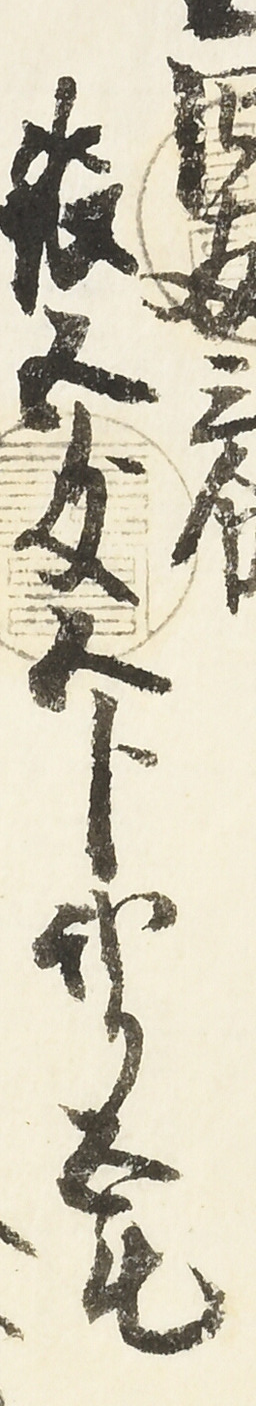一銀弐匁五分弐厘五毛
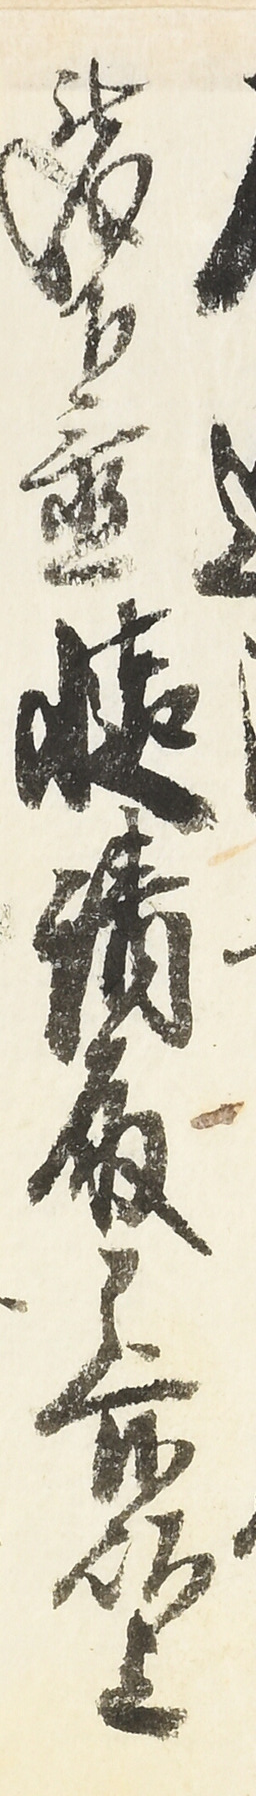被成下置慥請取申上候以上
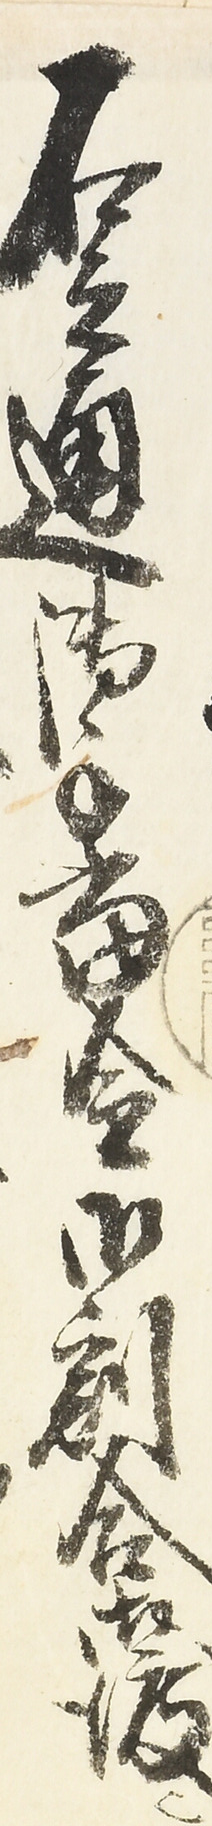右之通御手当金御割合御渡し
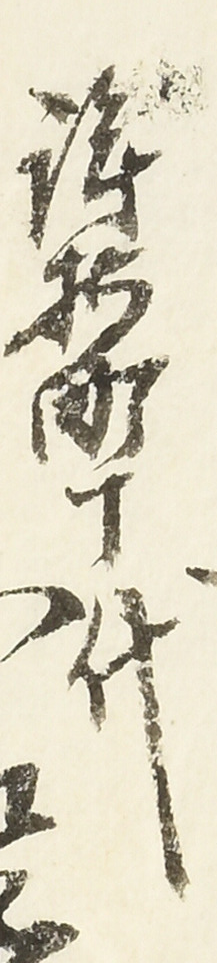鉾持町丁代
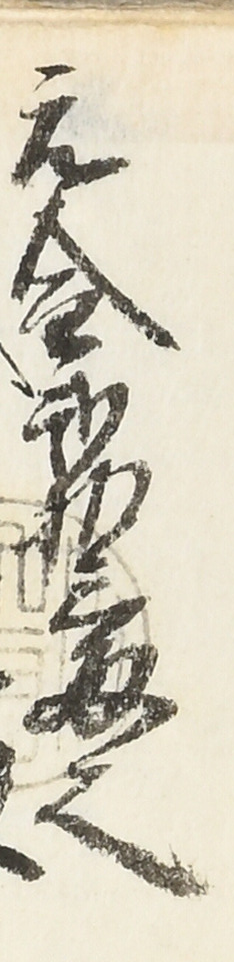元金弐拾三両也
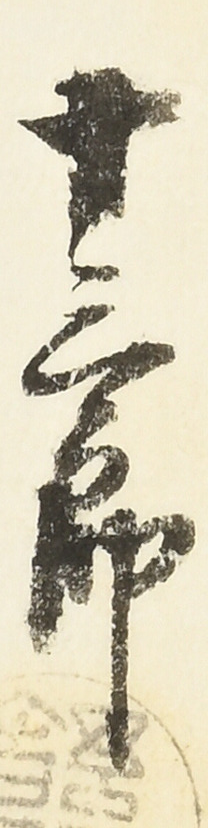十三郎
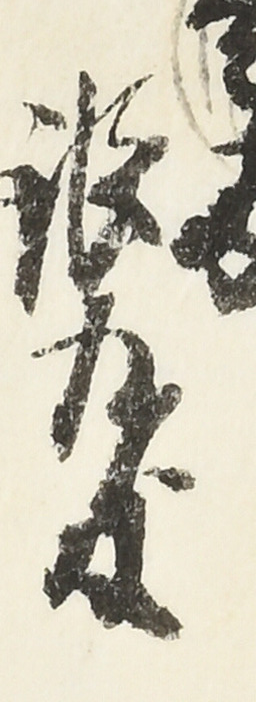銀九匁
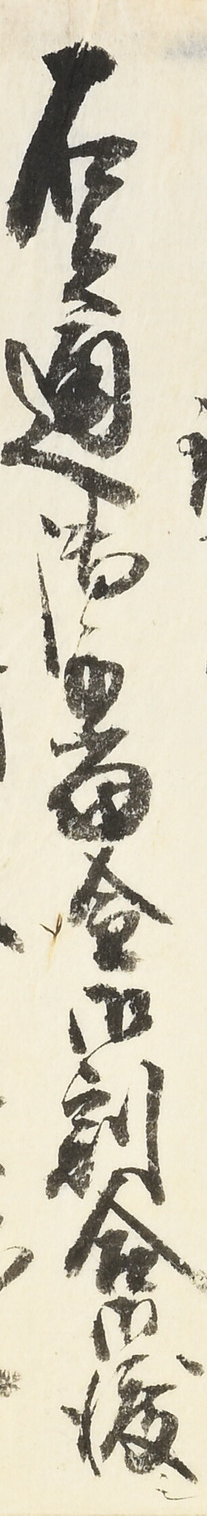右之通御手当金御割合御渡し
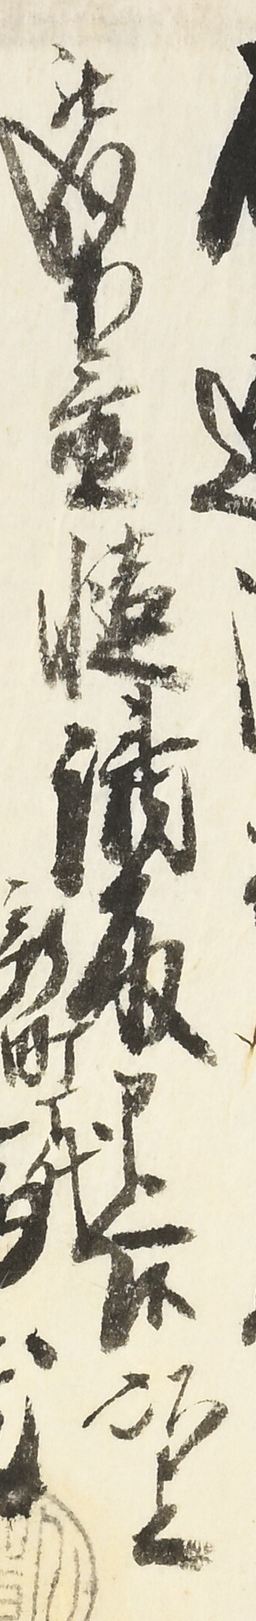被成下置慥請取申上候以上

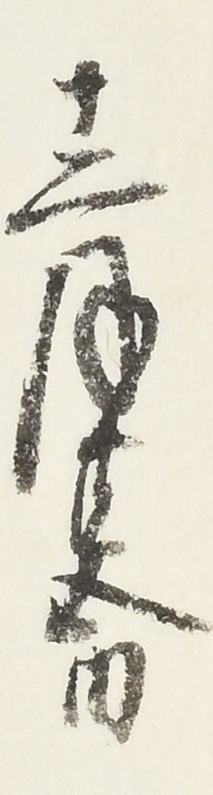十二月廿五日
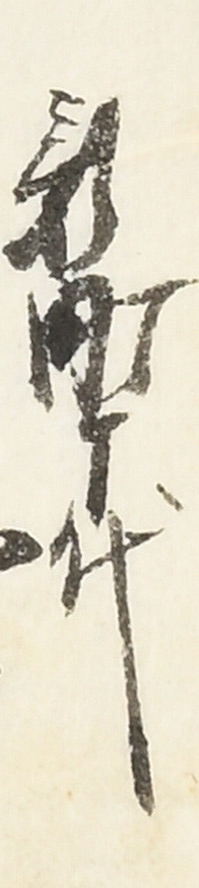新町丁代
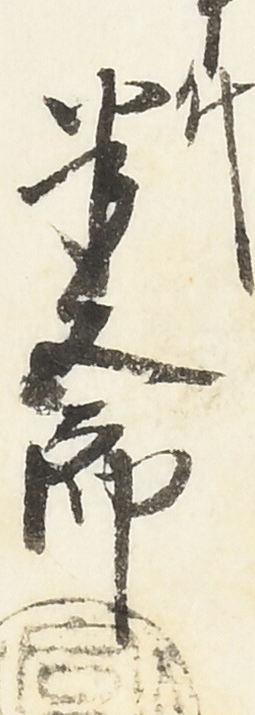半五郎
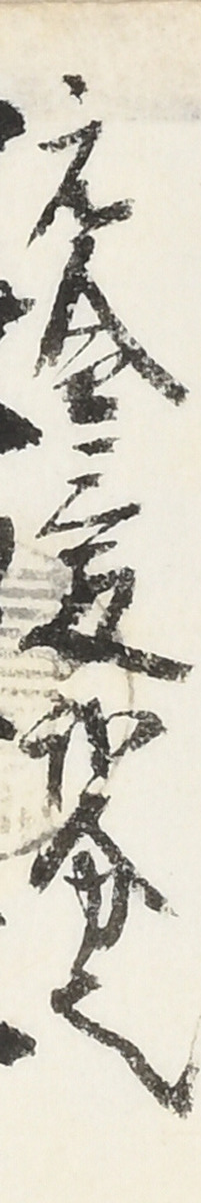元金三両弐分也
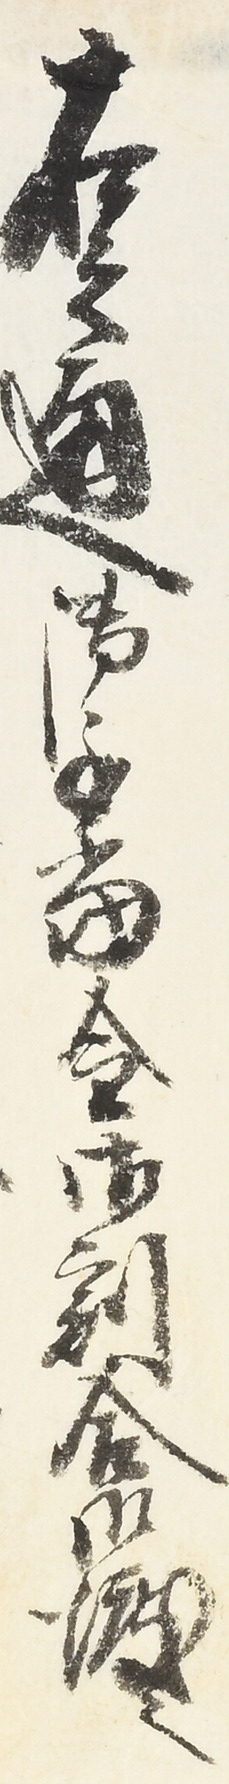右之通御手当金御割合御渡し
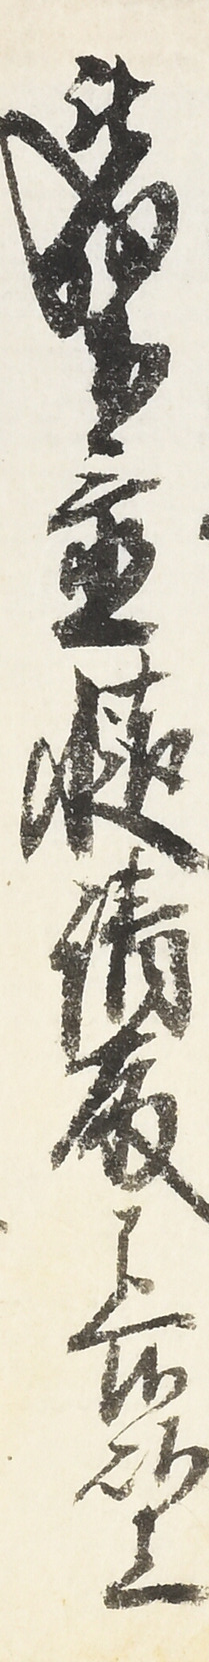被成下置慥請取申上候以上
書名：御才覚金御利足割渡扣帳
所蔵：伊那市立高遠町図書館・合同会社AMANE
